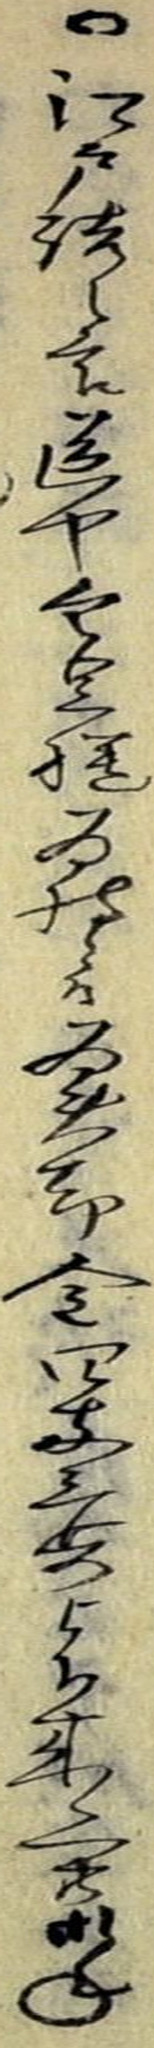〇江戸詰之節道中具足櫃為持ニ付為失却金四両三歩被下来候へ共御年
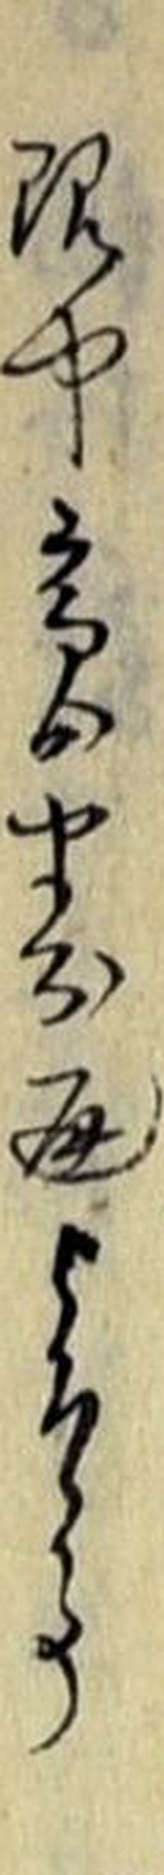限中高ゟ半分通被下候事
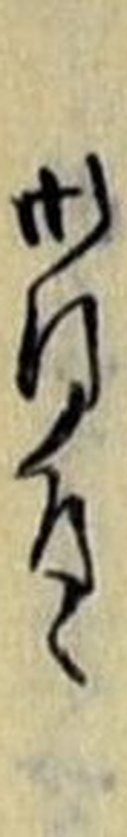御目付へ
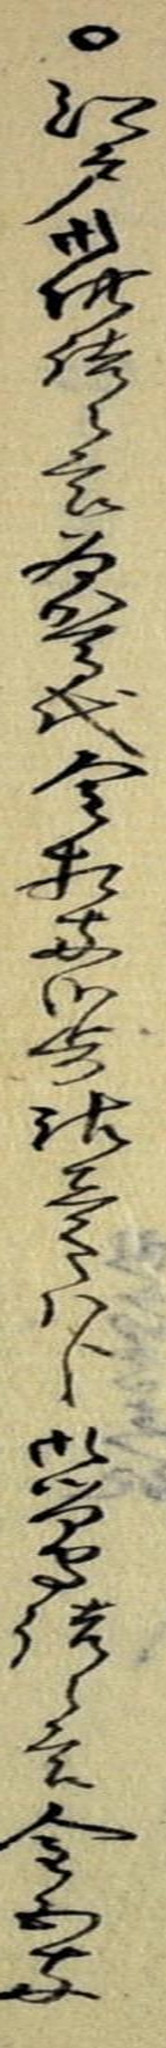〇江戸御供詰之節為駕代金拾両弐歩銀壱匁八分御留守詰之節金五両
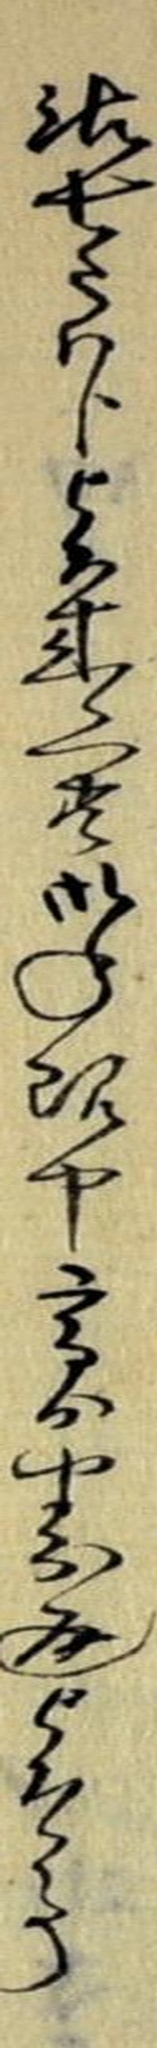銀七匁八分被下来候へ共御年限中高ゟ半分通被下候事
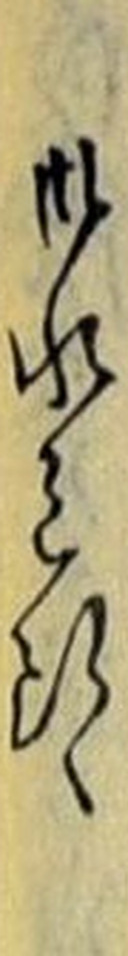御水主頭へ
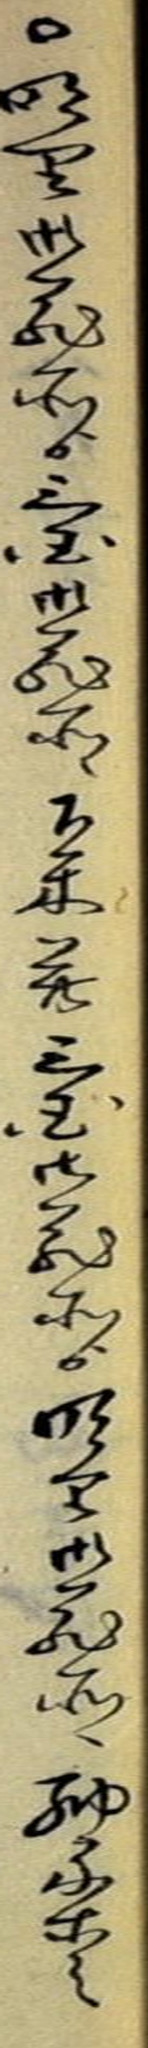〇明里御蔵所ゟ三国御蔵所へ下米并三国御蔵所ゟ明里御蔵所へ納米等之
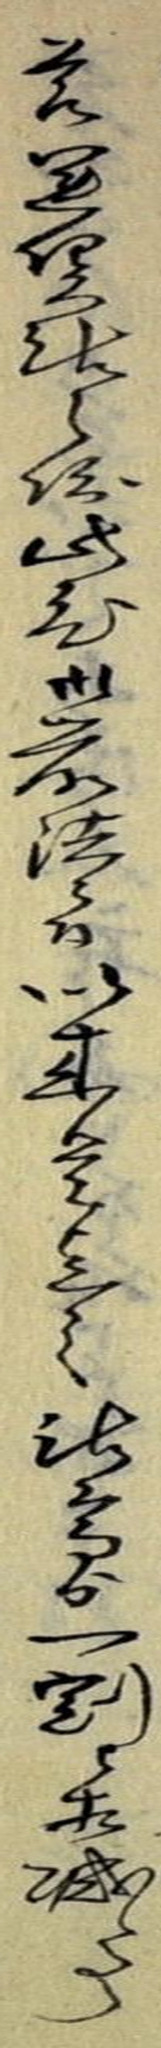節運賃銀之儀此度御厳法ニ付以来是迄之銀高ゟ一割被相減候事
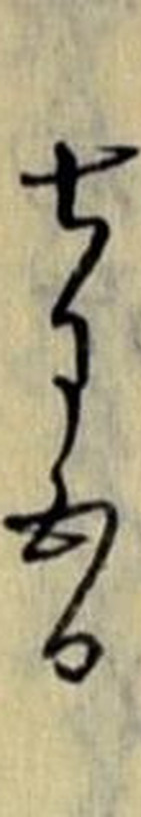七月五日
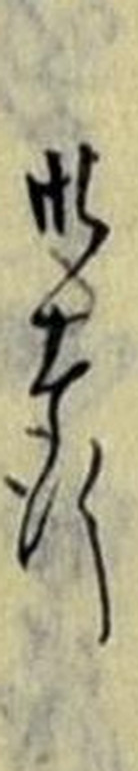御奉行
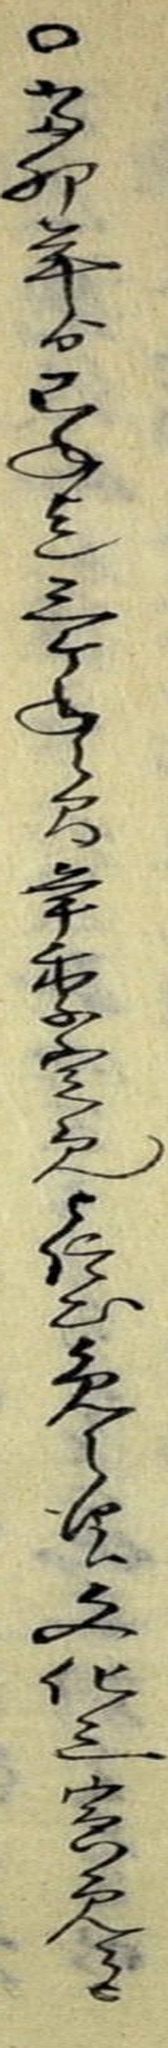〇当卯年ゟ巳年迄三ケ年之間年季定免被仰出免之儀ハ文化三寅免ニ被
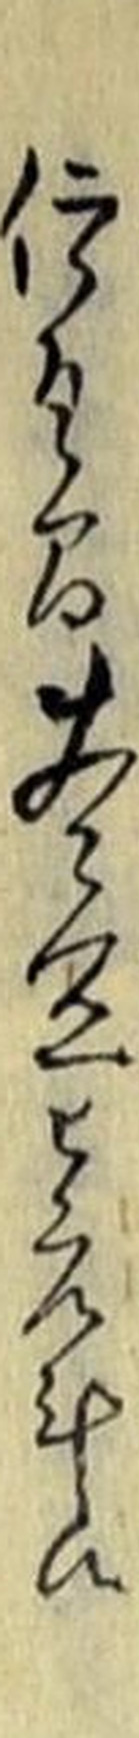仰付候間夫々宜被取計候
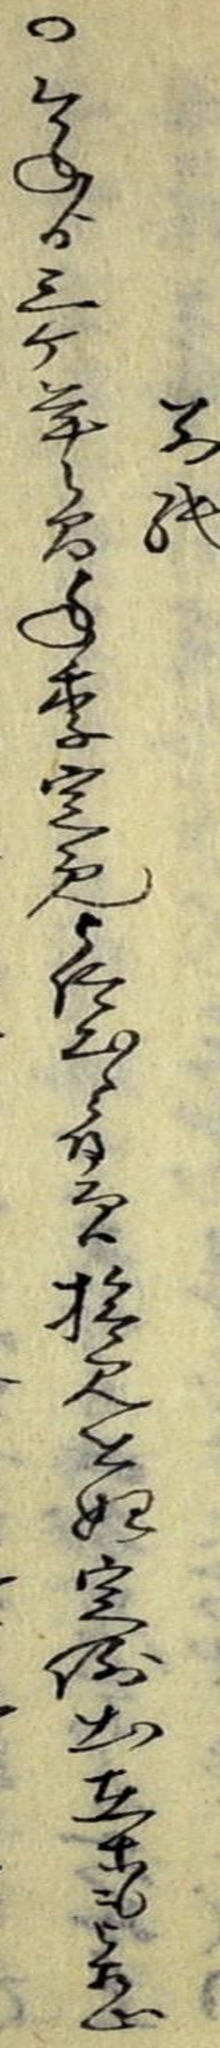〇今年ゟ三ケ年之間年季定免被仰出候ニ付而ハ検見を始定例出在等も被相止
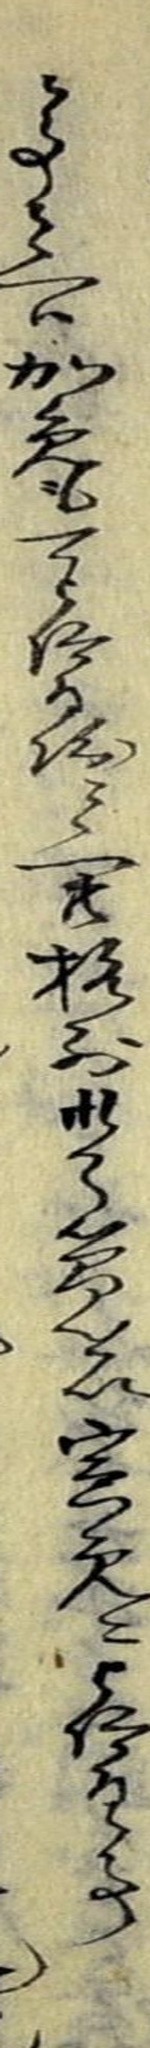ニ事ニ候へハ加免も可被仰付儀ニ候へ共格別御了簡を以定免ニ被仰付候事
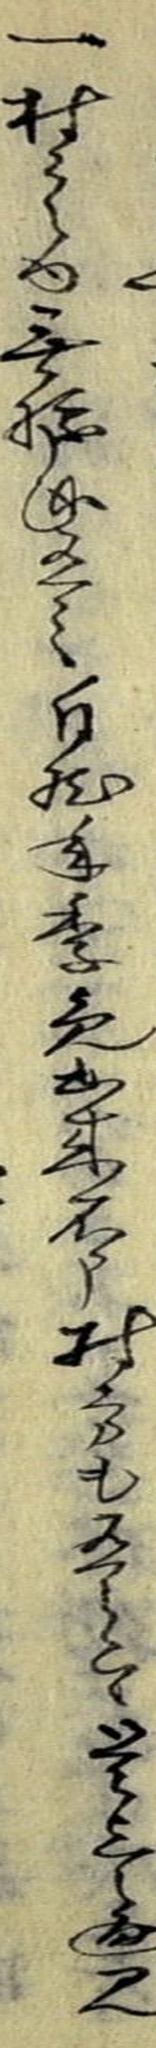一村々之内無拠趣有之自然年季免出来不申村方も有之候ハヽ是迄之通見
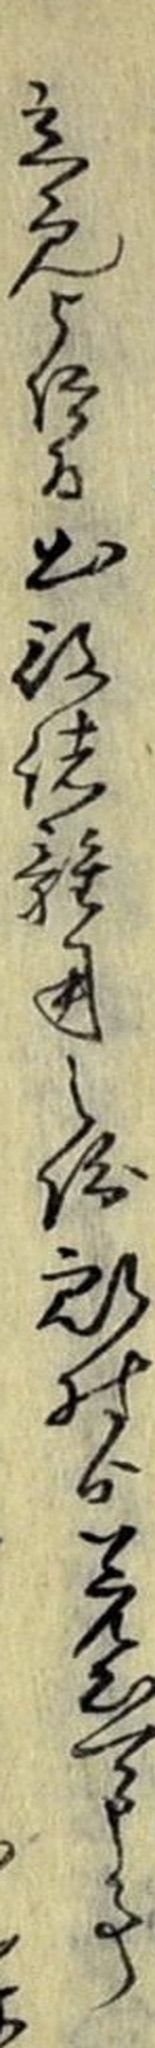立免被仰付出役諸雑用之儀郡村ゟ差出可申事
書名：命令之部 五
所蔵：福井県文書館 Fukui Prefectural Archives
